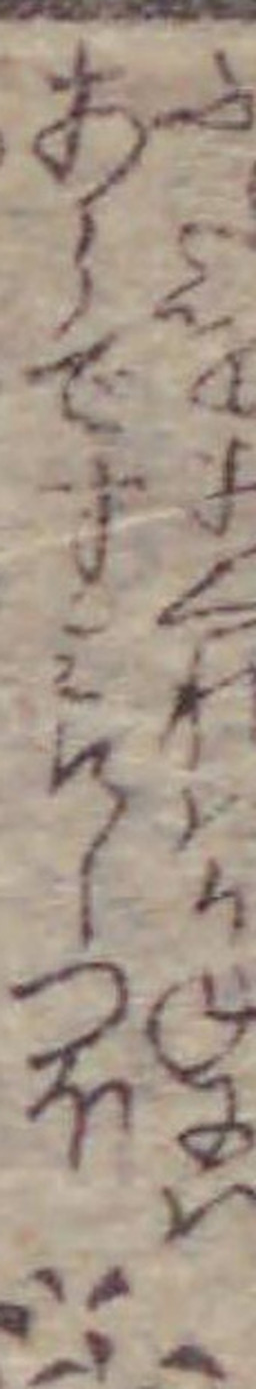あらですみけしつぼ
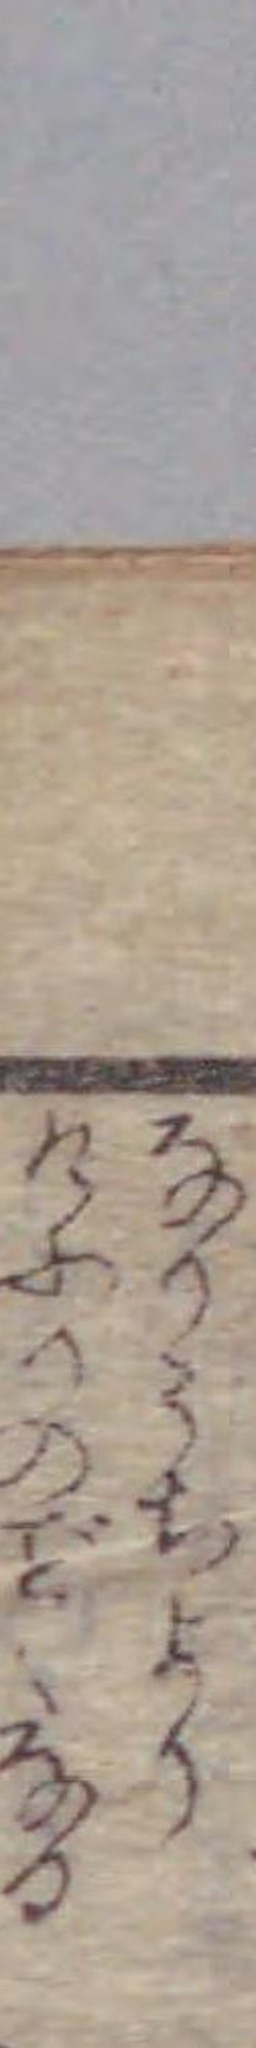けふりのごとくなる
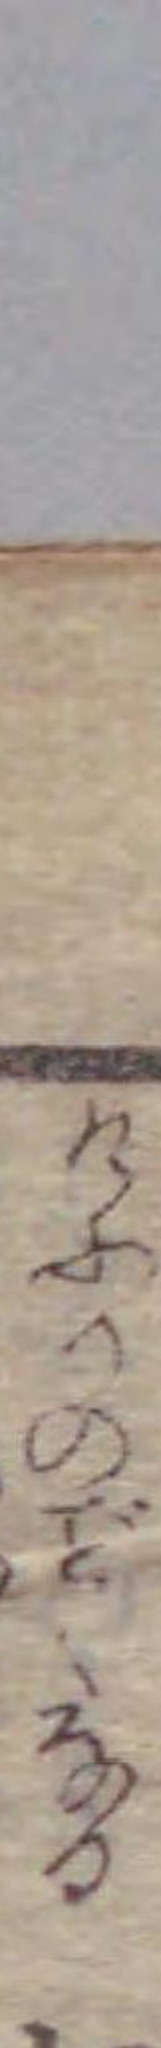けふりのごとくなる
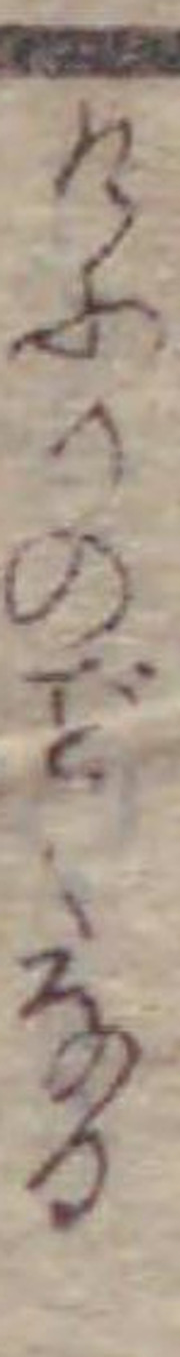けふりのごとくなる
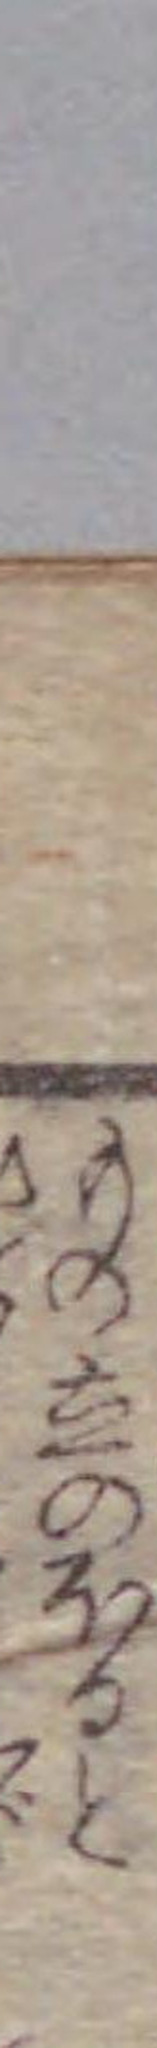もの立のほると
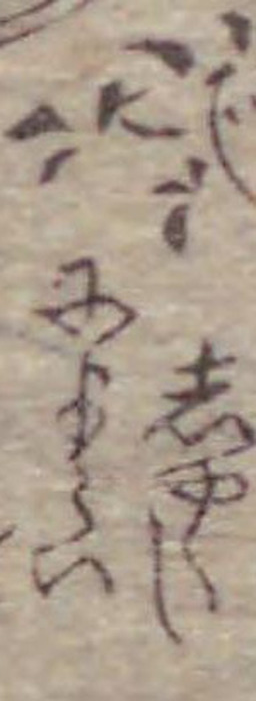によらい
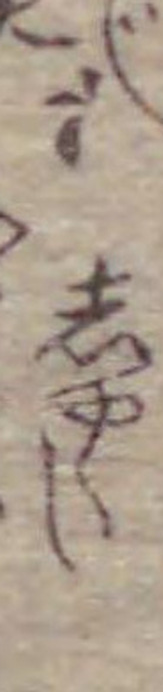しやく
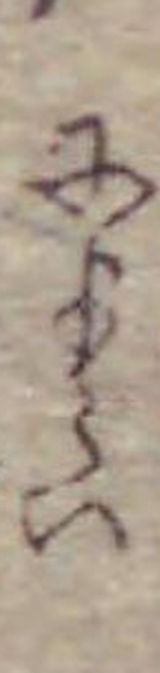によらい
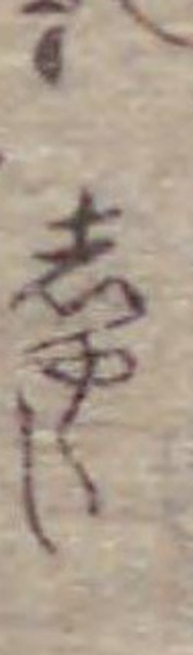しやく
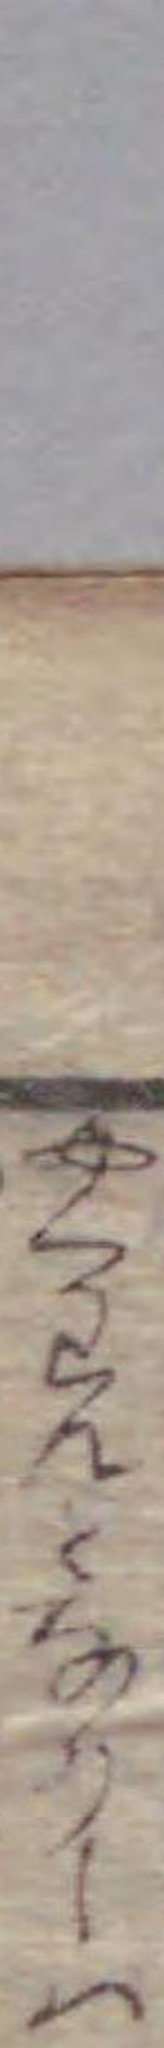やくわんとなりしは
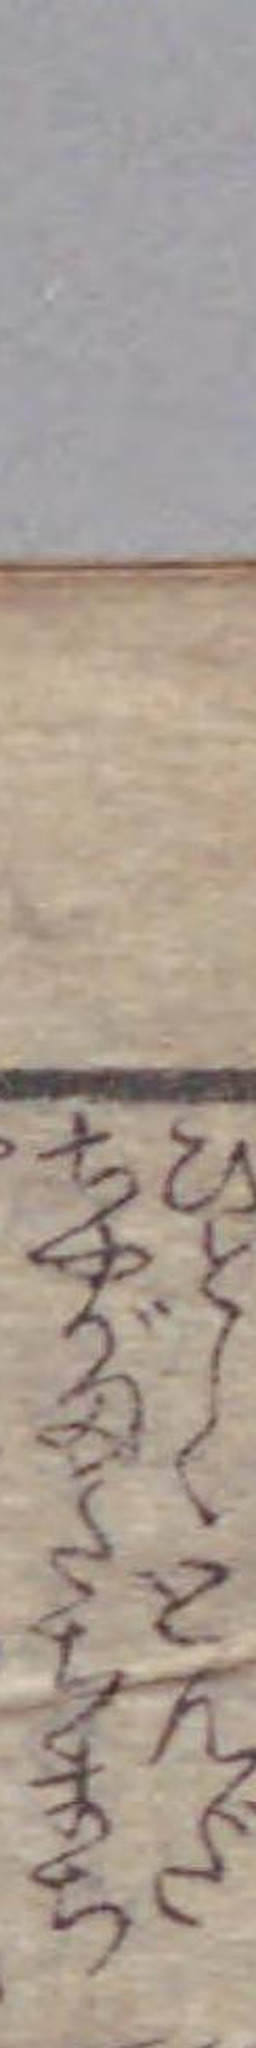ちやがまたちまち
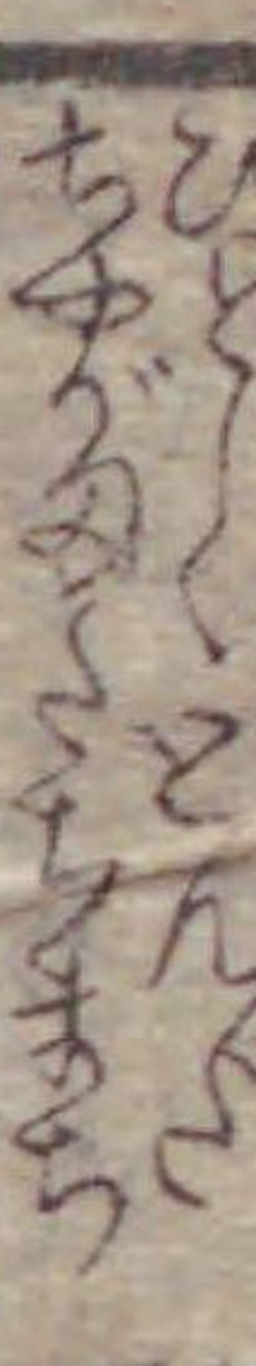ちやがまたちまち
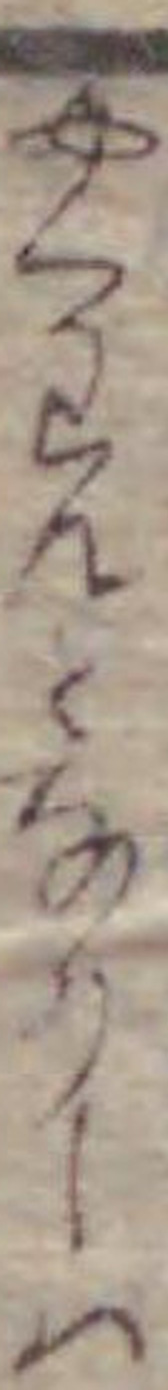やくわんとなりしは
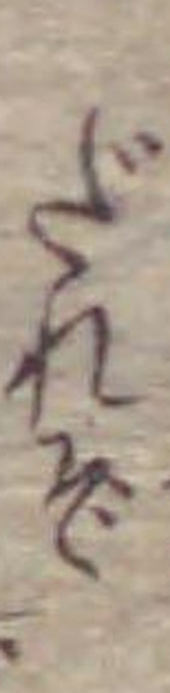だれぞ
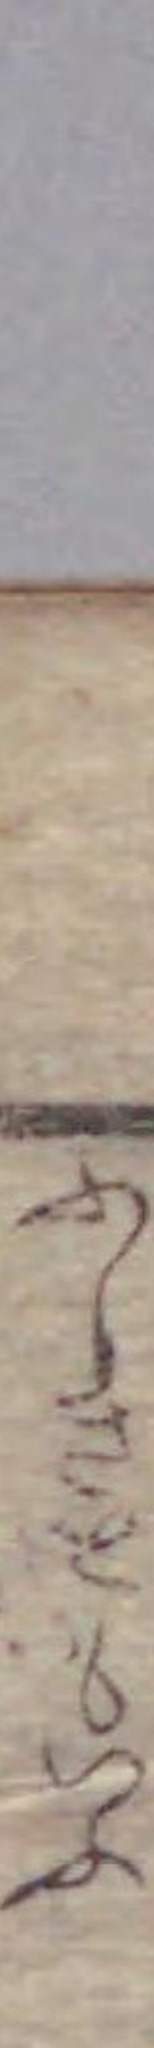ふしきともいふ
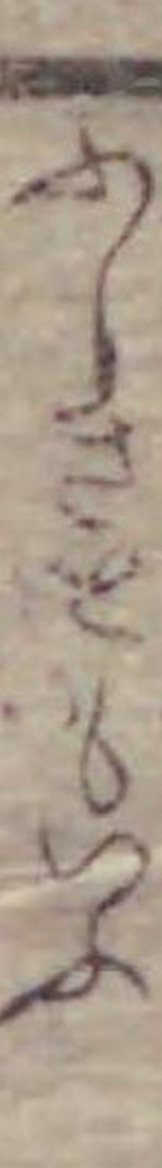ふしきともいふ
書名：万物小遣帳 : 2巻
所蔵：国立国会図書館 National Diet Library, JAPAN
